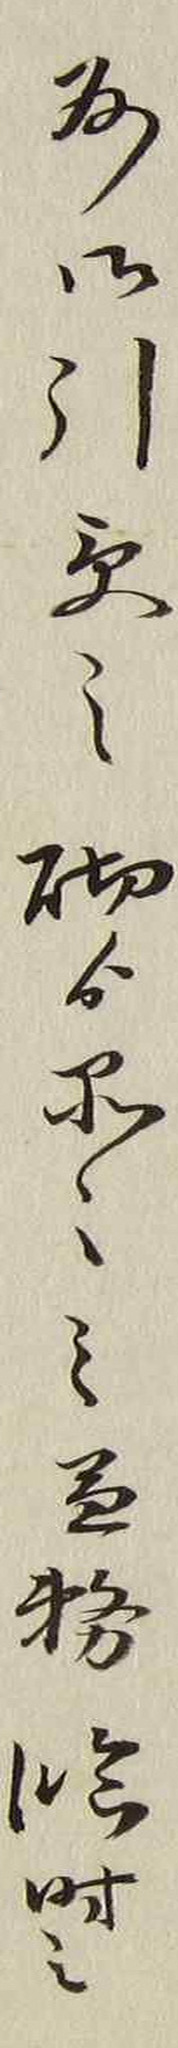州御引受之砌より品々之兼務臨時之

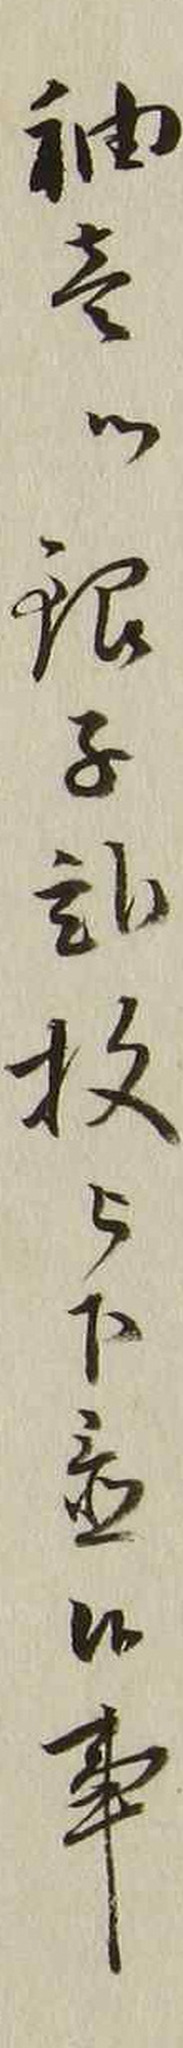袖壱ッ銀子弐枚下し置かれ候事
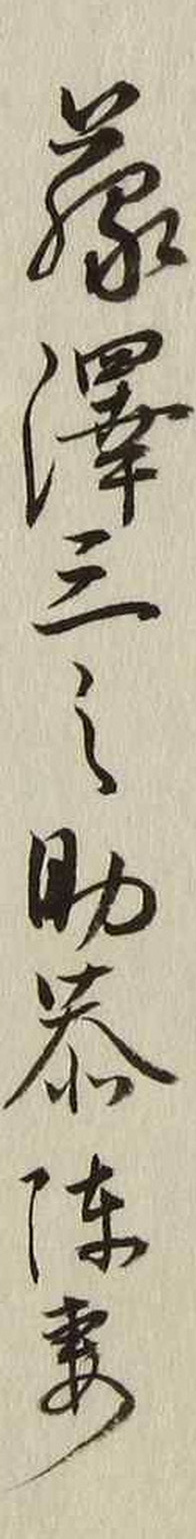女藤澤三之助恭陣妻
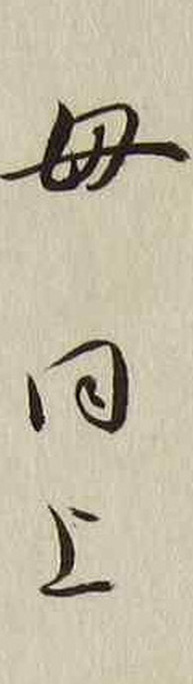母同上
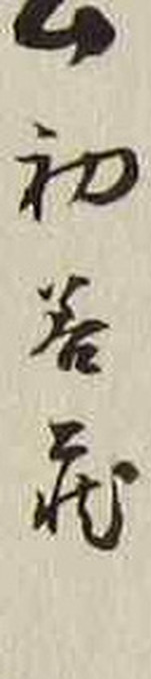初善蔵
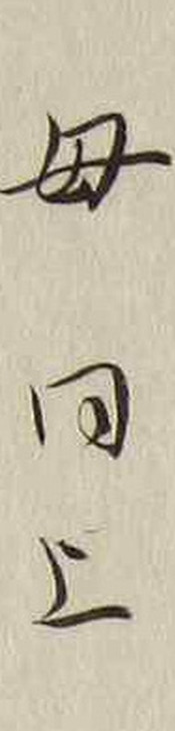母同上

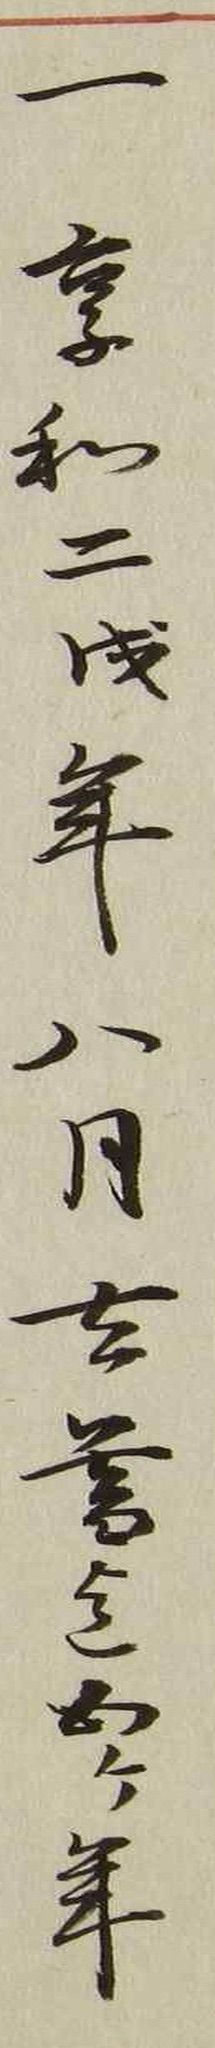一享和二戌年八月去る暮迄五ケ年
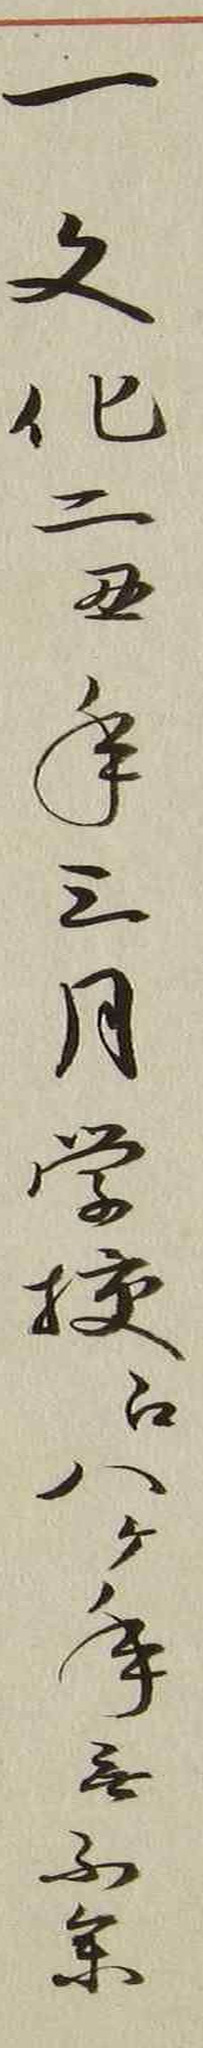一文化二丑年三月学校へ八ケ年不参無く
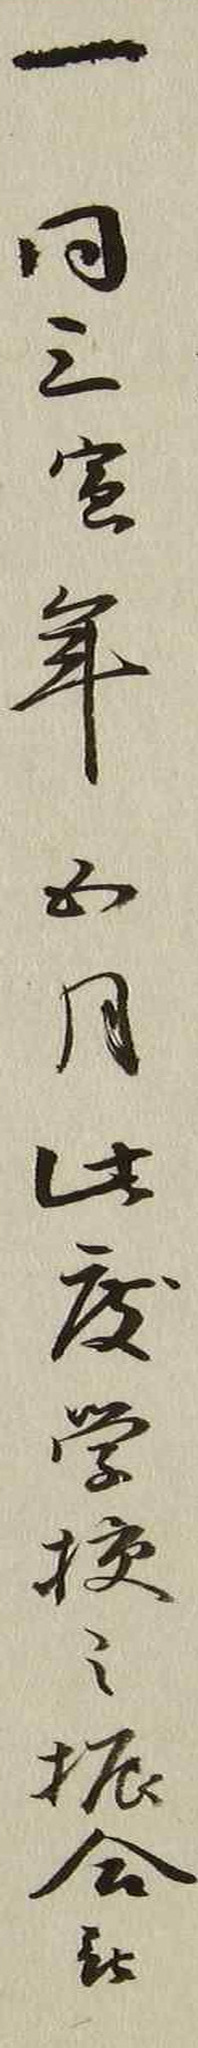一同三寅年五月此度学校之振れ合い
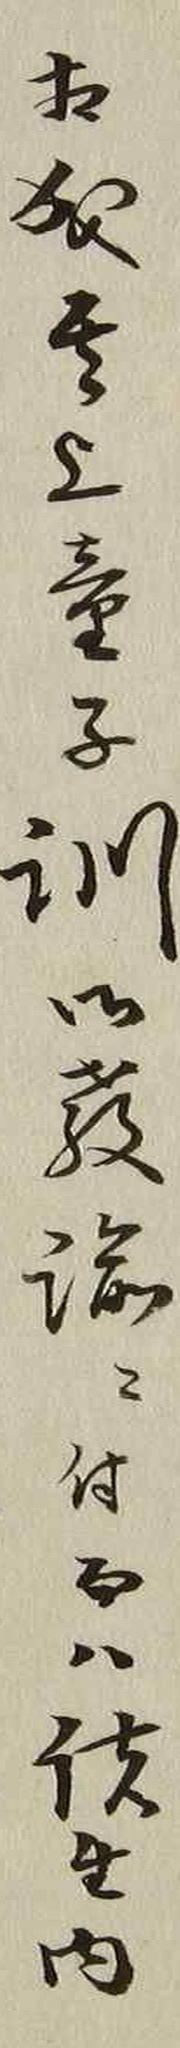相成其上童子訓御教諭ニ付きてㇵ伕生内
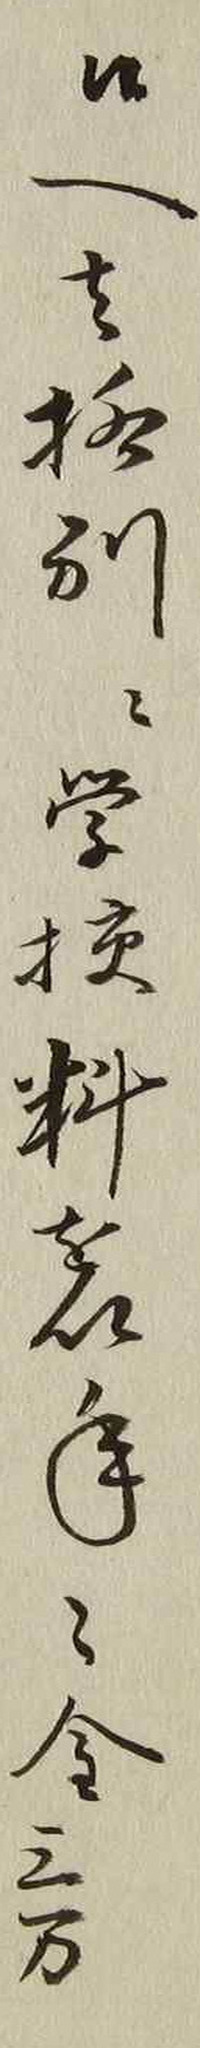候へバ格別ニ学校料を以て年々金三万
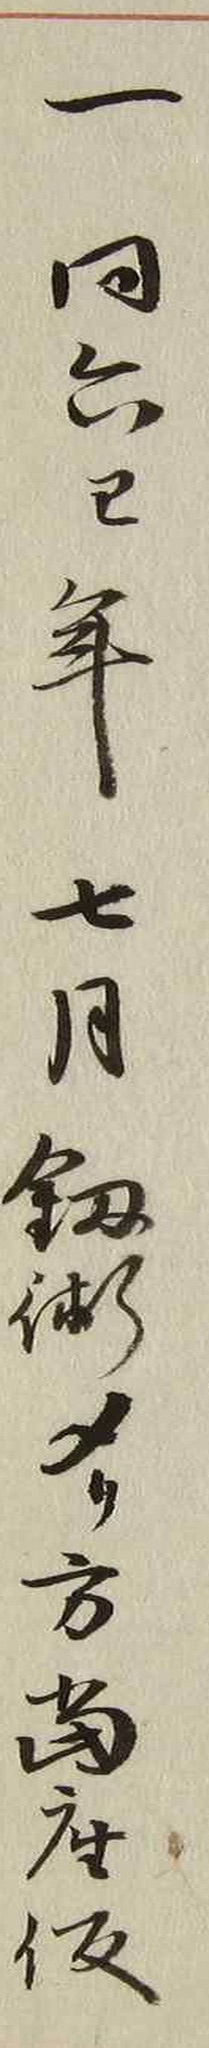一同六巳年七月釼術〆り方当座仮
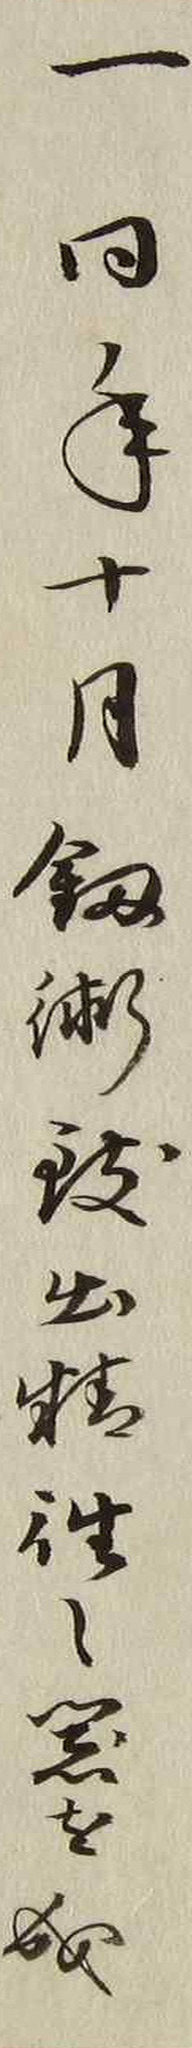一同年十月釼術出精致し往之器を成し
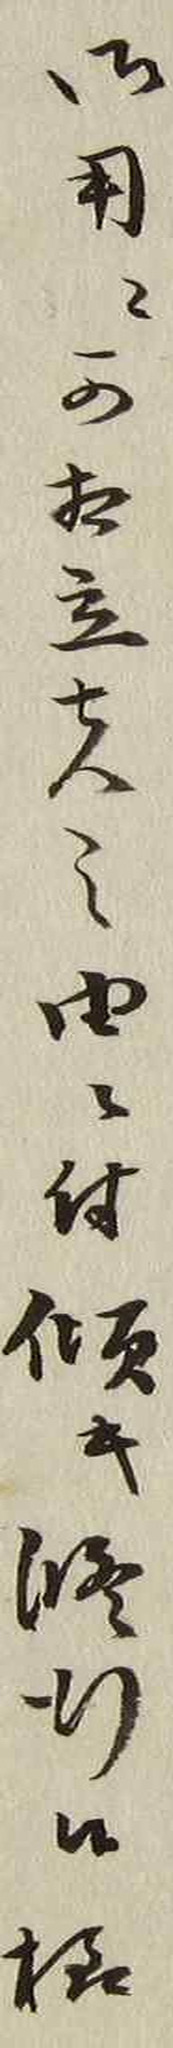御用ニ相立べく者之由ニ付き傾キ修行候様

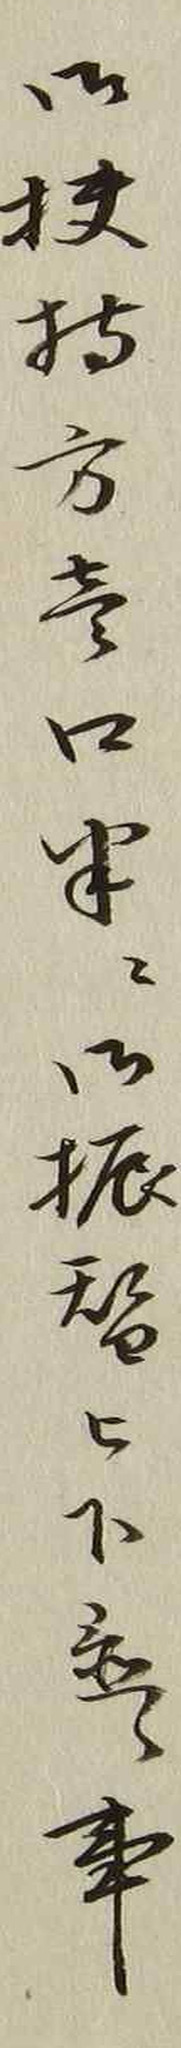御扶持方壱口半ニ御振替下し置かれ候事
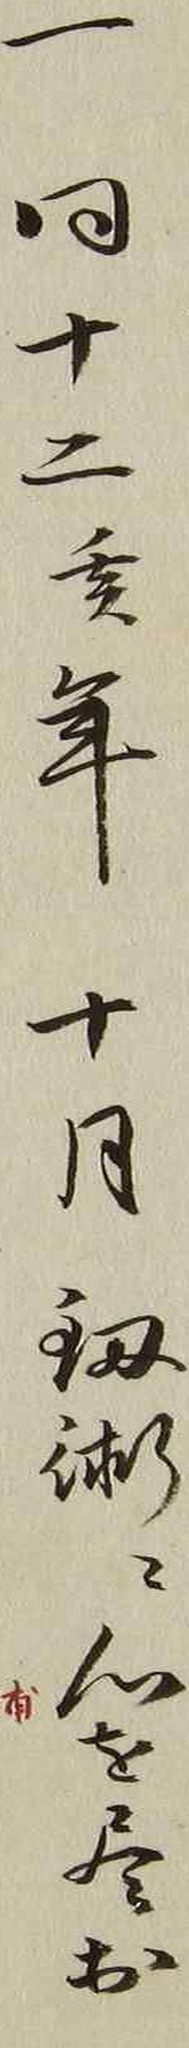一同十二亥年十月釼術ニ心を尽くし
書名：諸士系譜　巻之16　い之部16
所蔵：会津若松市立会津図書館
